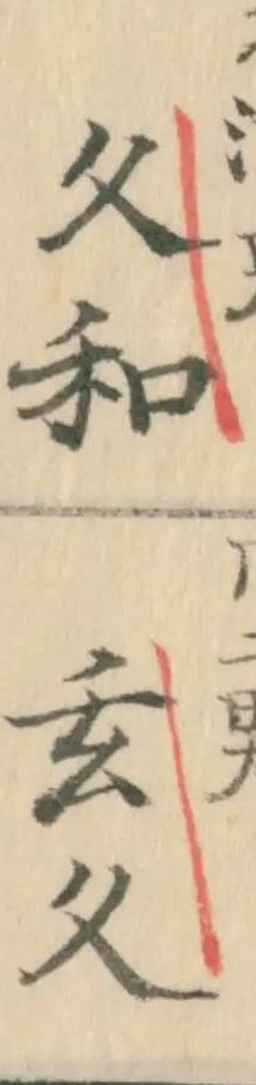久和玄久
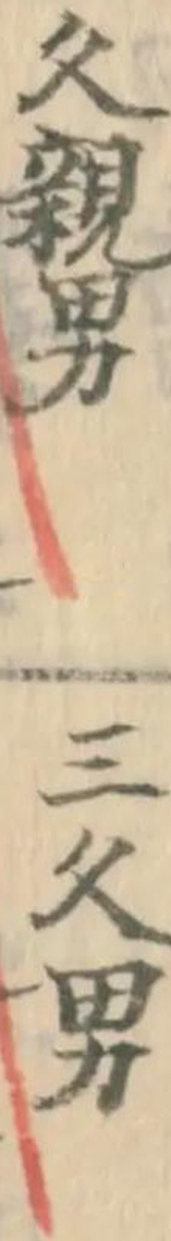久親男三久男
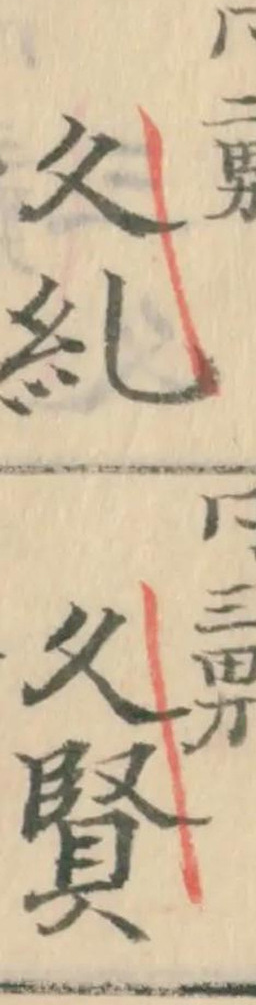久糺久賢

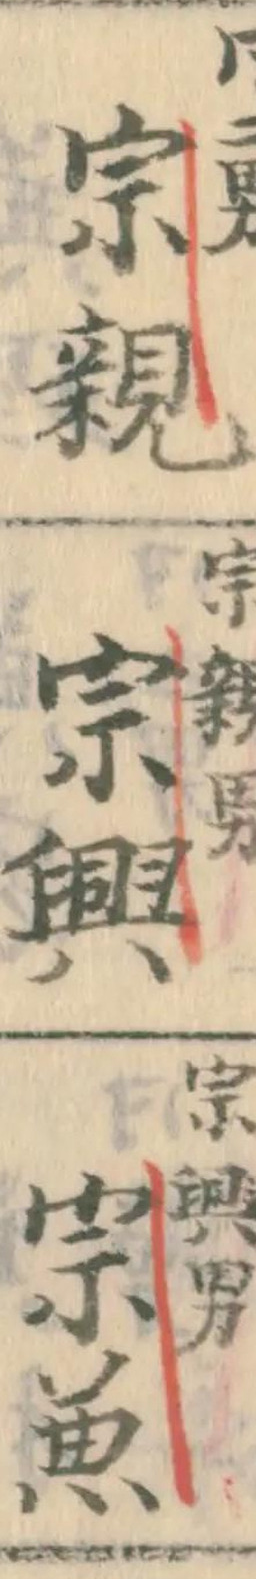宗親宗興宗兼
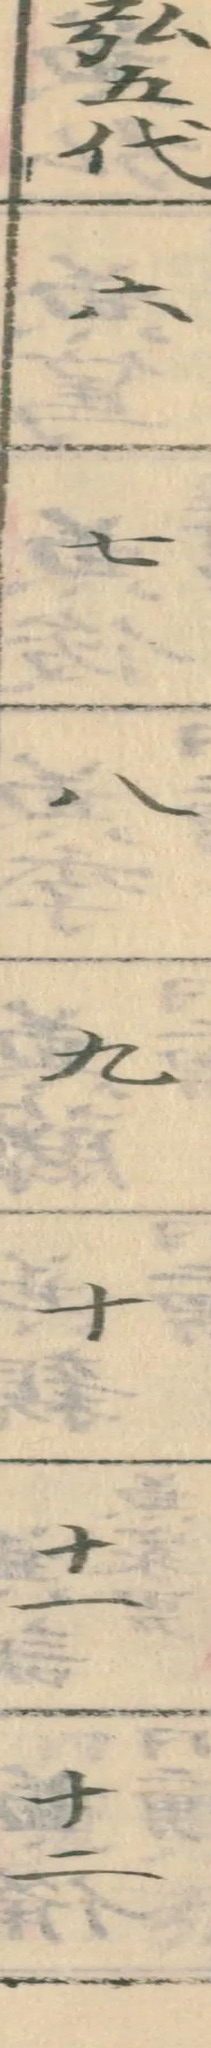弘五代六七八九十十一十二
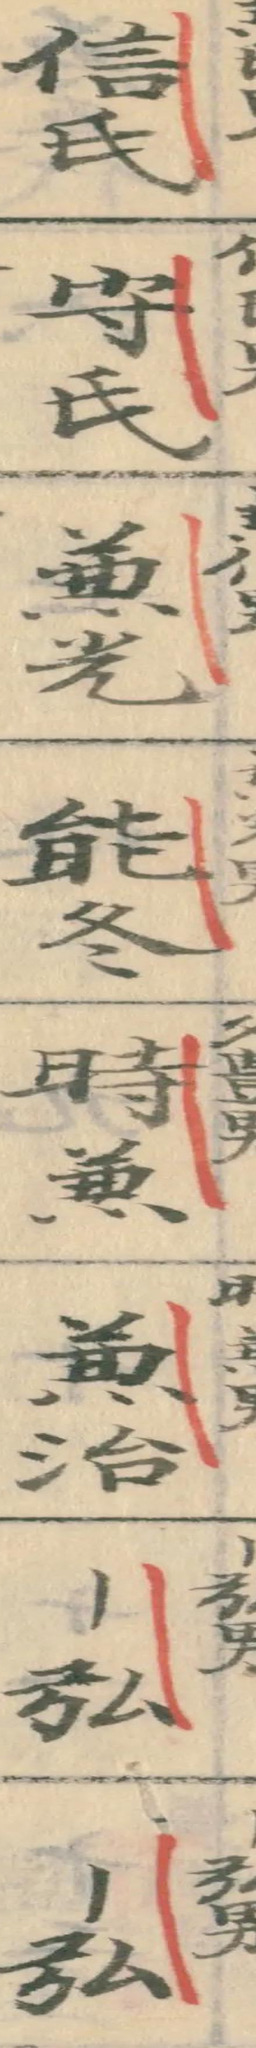信氏守氏兼光能冬時兼兼治ー弘ー弘
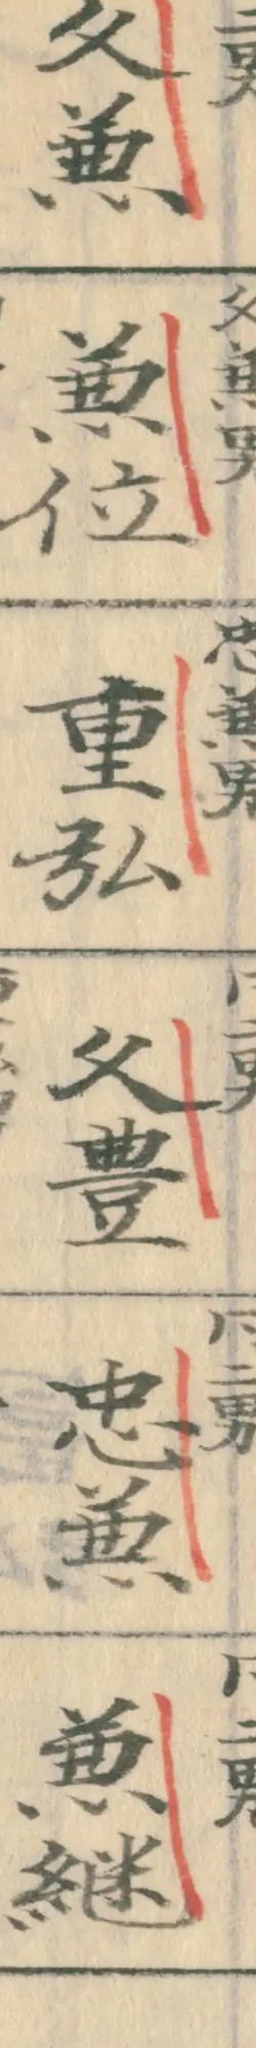久兼兼位重弘久豊忠兼兼継
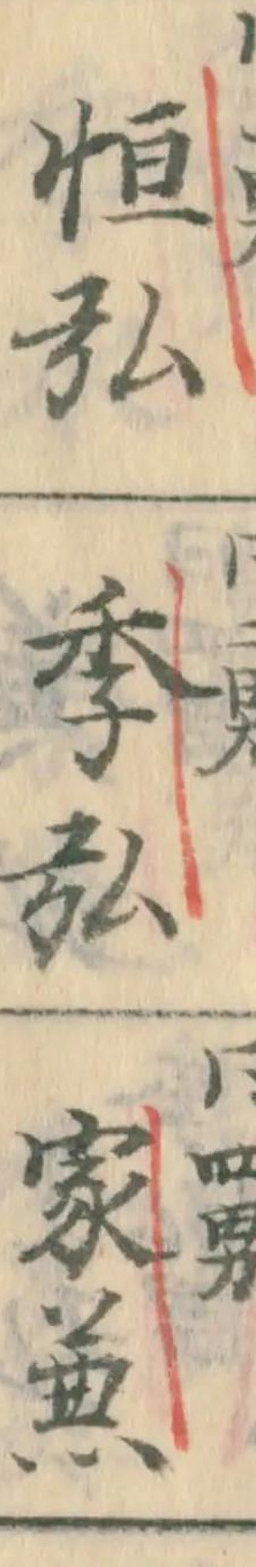恒弘季弘家兼

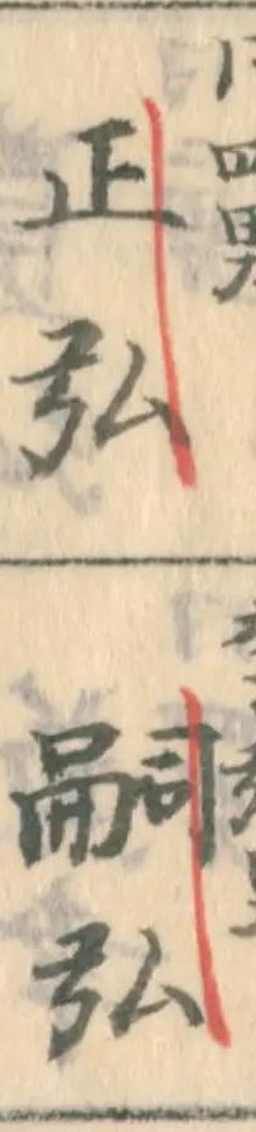正弘嗣弘
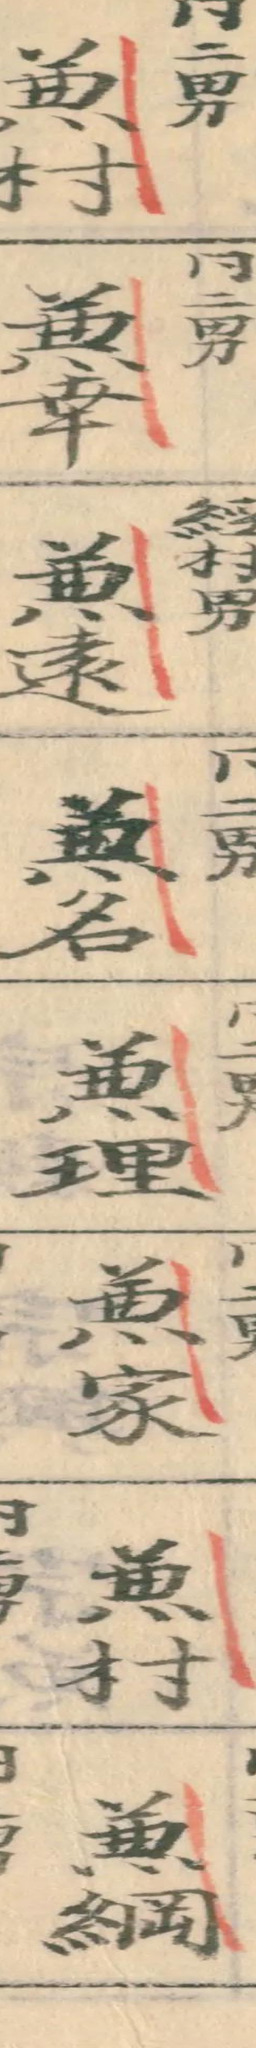兼村兼幸兼遠兼名兼理兼家兼村兼綱

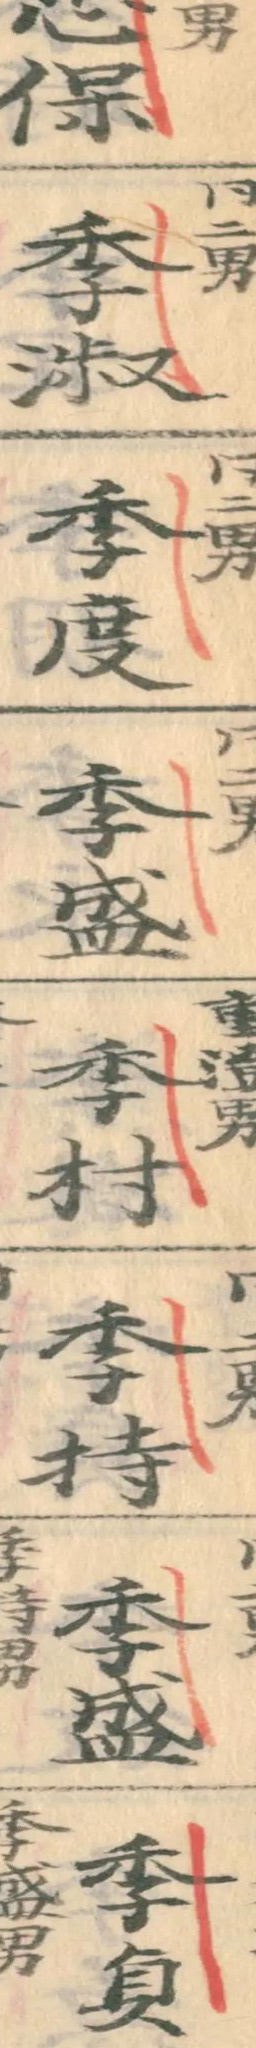忠保季淑季度季盛季村季持季盛季貞
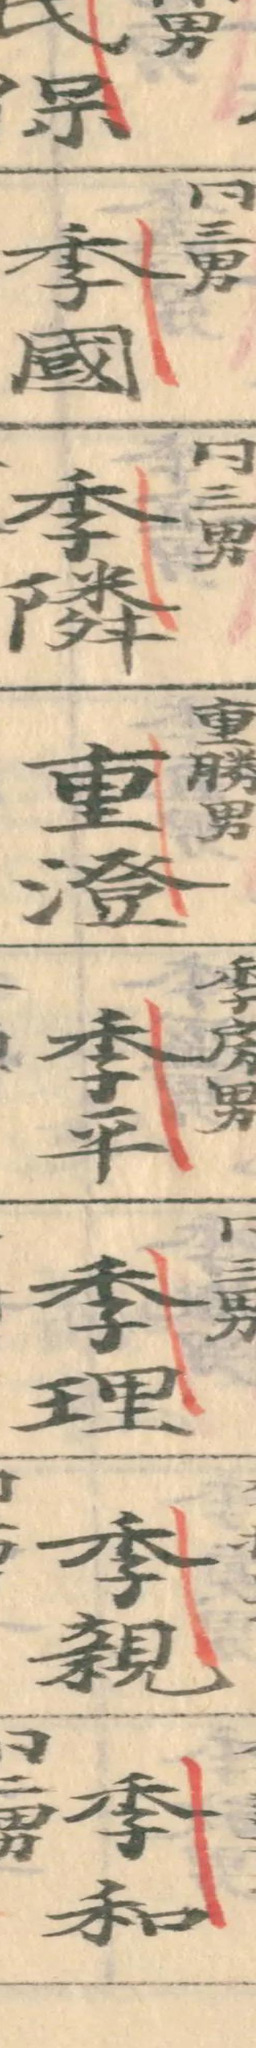氏保季国季隣重澄季平季理季親季和
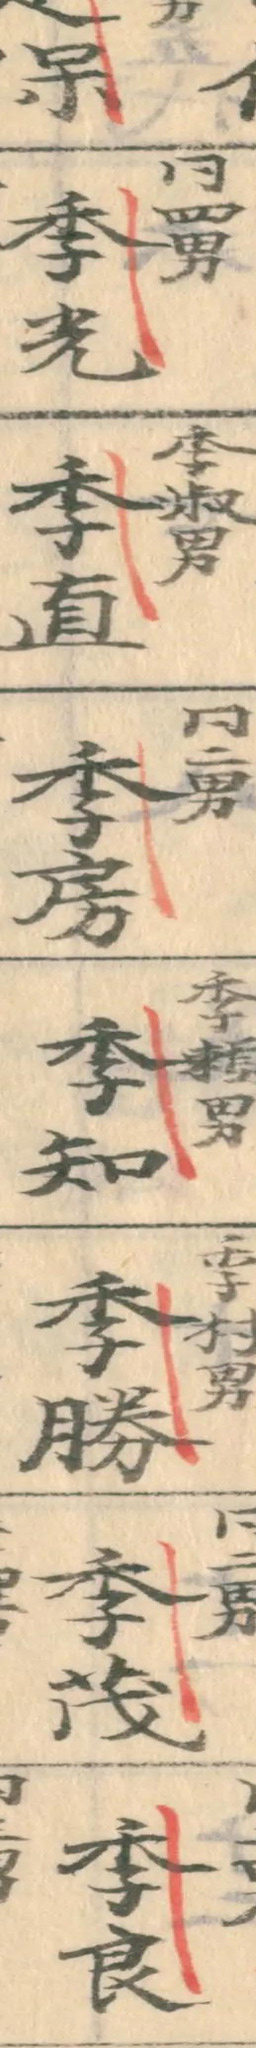定保季光季直季房季知季勝季茂季良
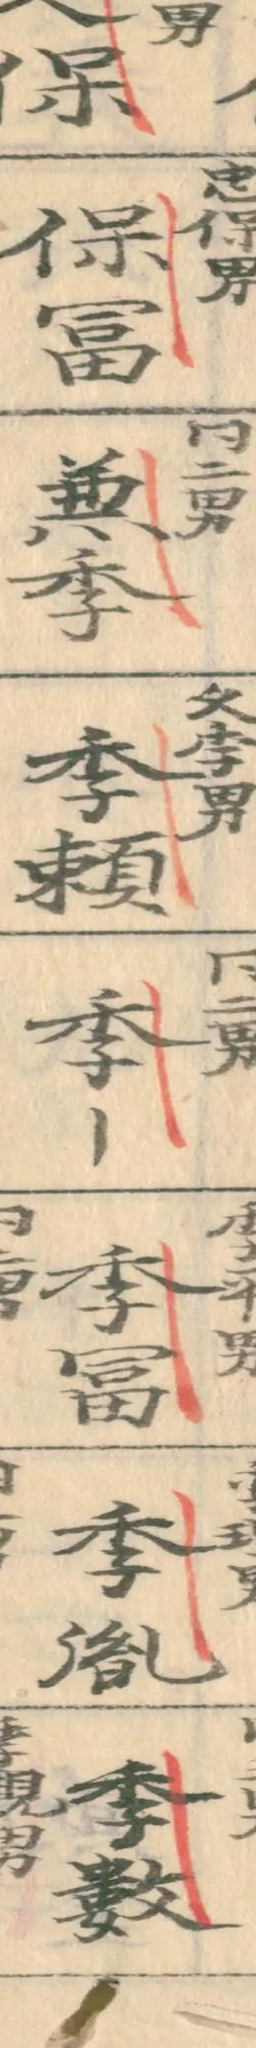久保保冨兼季季頼季ー季冨季胤季数
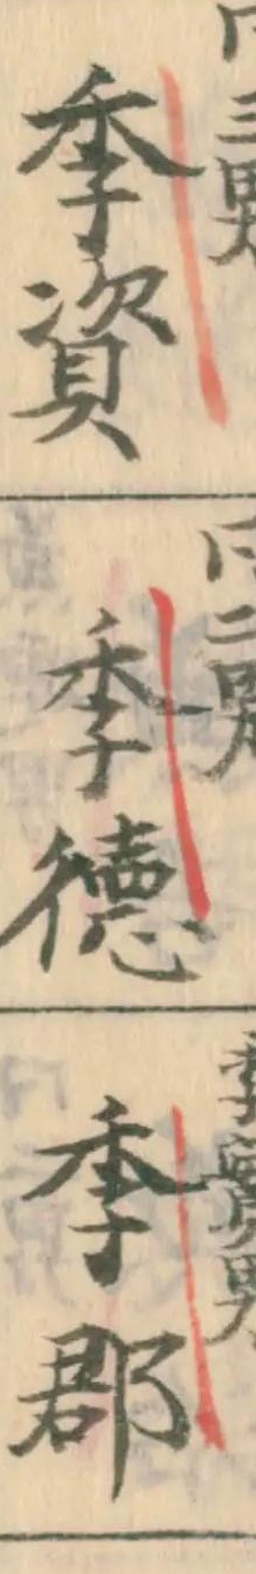保重季資季徳季郡
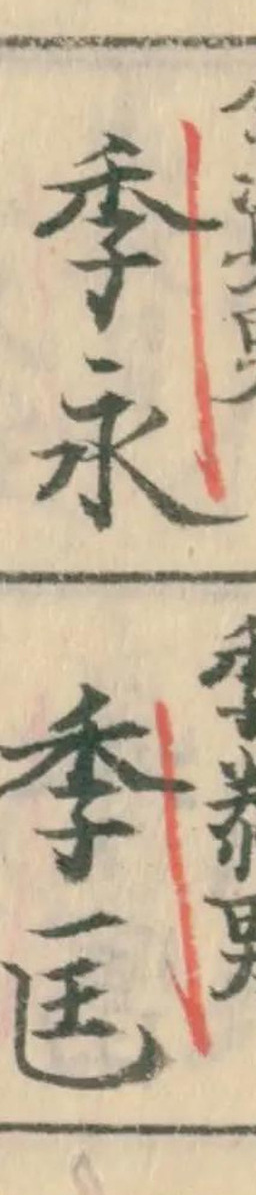季永季匡
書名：賀茂社記録. 第24冊
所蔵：国立国会図書館 National Diet Library, JAPAN
